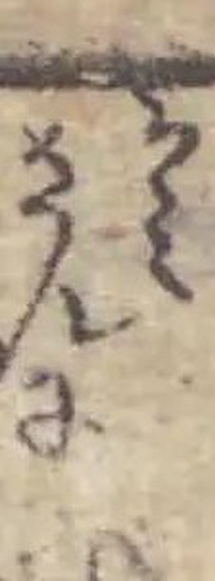さんに
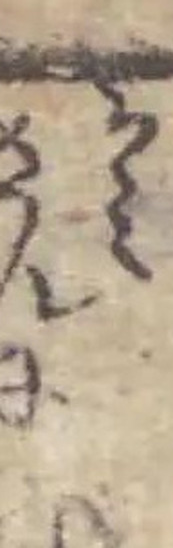さんに
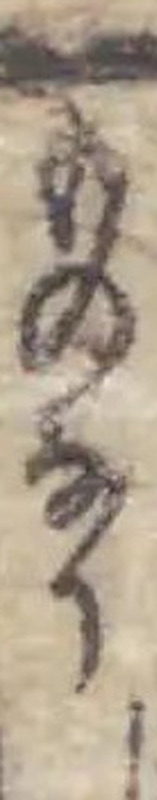ものなり

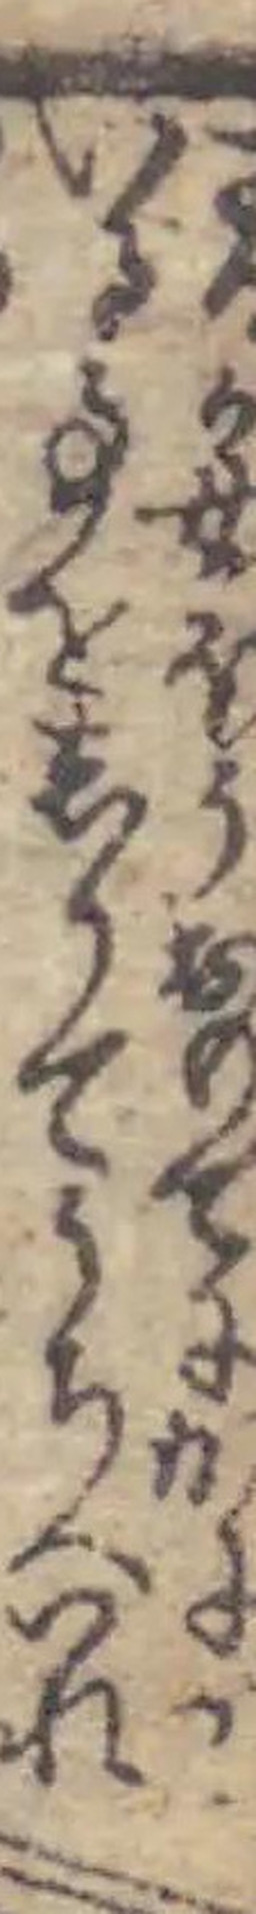いる事をしりてうちへいれ
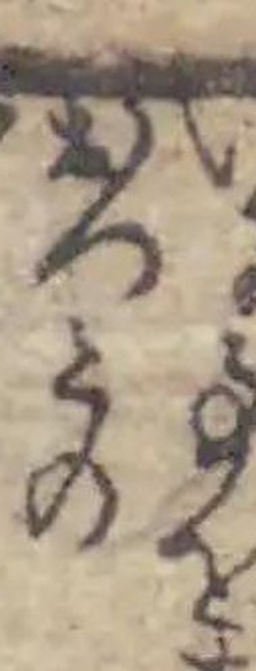おつとの
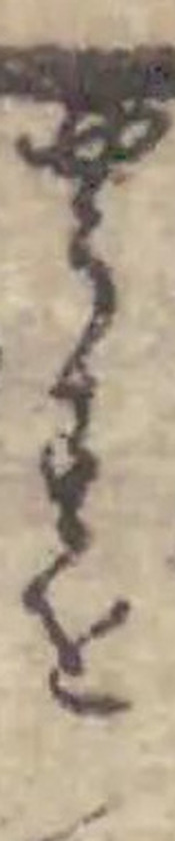やうすを
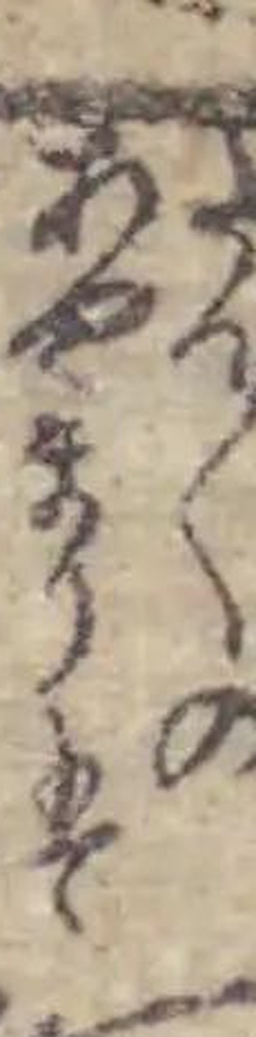あやまりにて
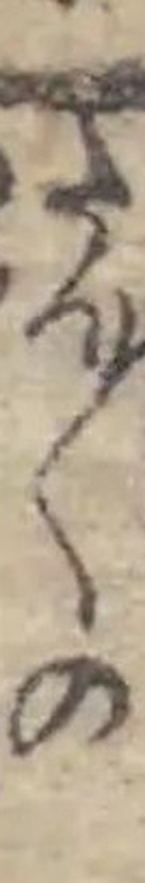たん〳〵の
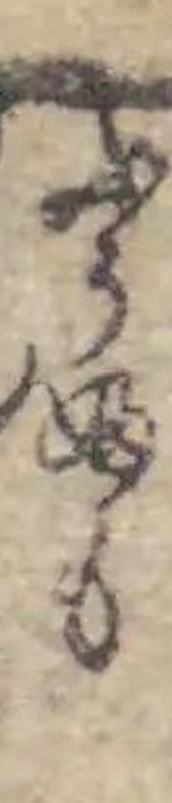ふうふも
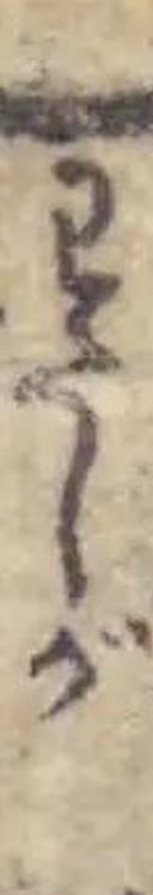わたしが
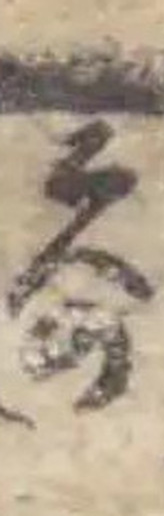二人の
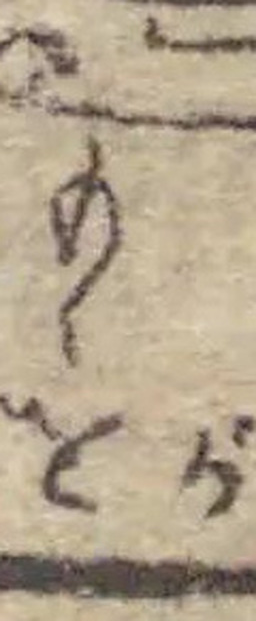もゝを
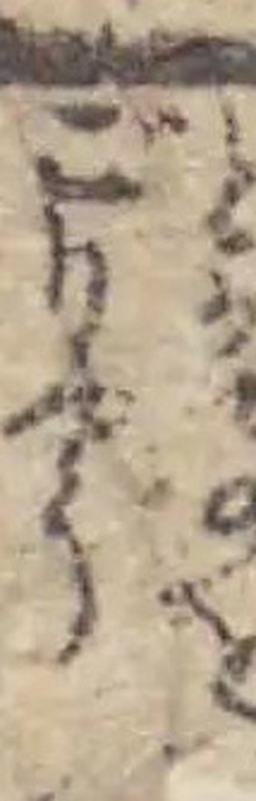ごりやう
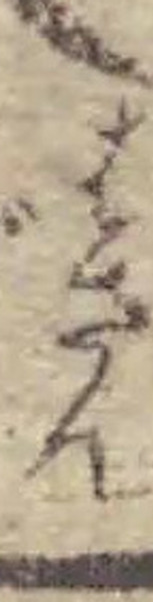はさん
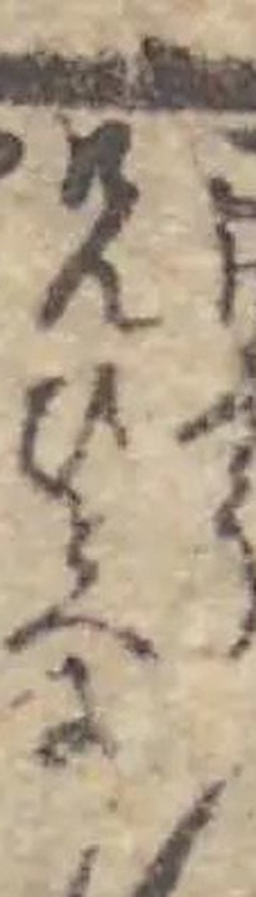けんひとへに
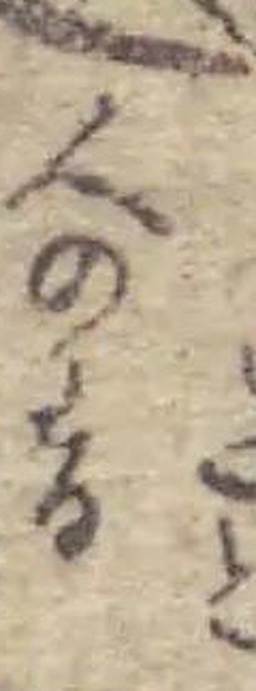人のわる
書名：蟹牛房挟多 3巻
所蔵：国立国会図書館 National Diet Library, JAPAN
